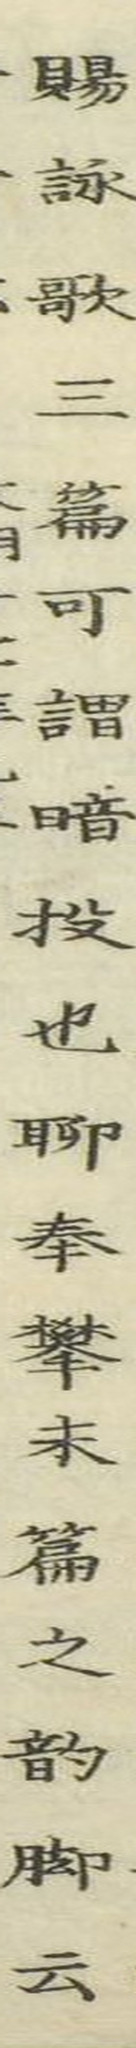賜詠歌三篇可謂暗投也聊奉攀未篇之韵脚云
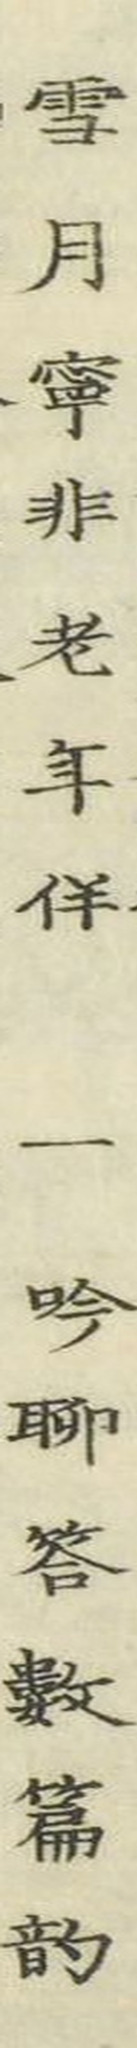雪月寧非老年伴一吟聊答数篇韵
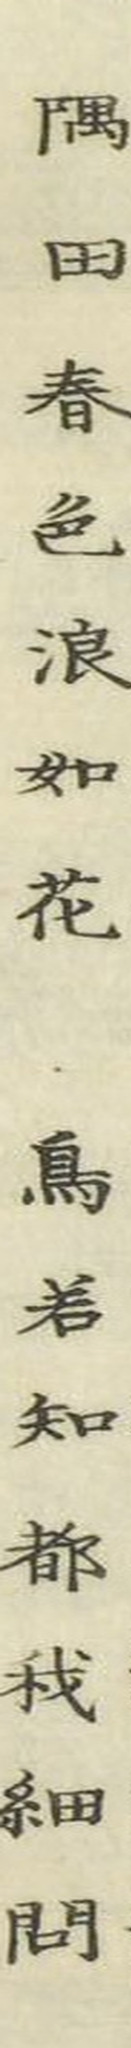隅田春色浪如花鳥若知都我細問
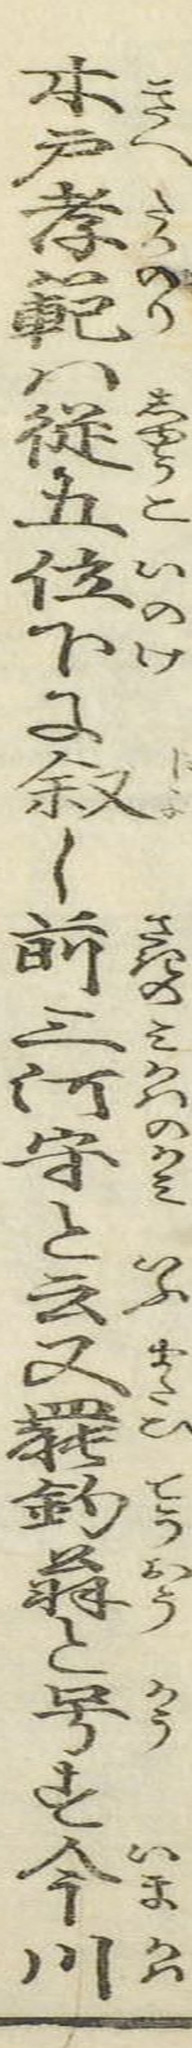木戸孝範は従五位下に叙し前三河守と云又罷釣翁と号す今川
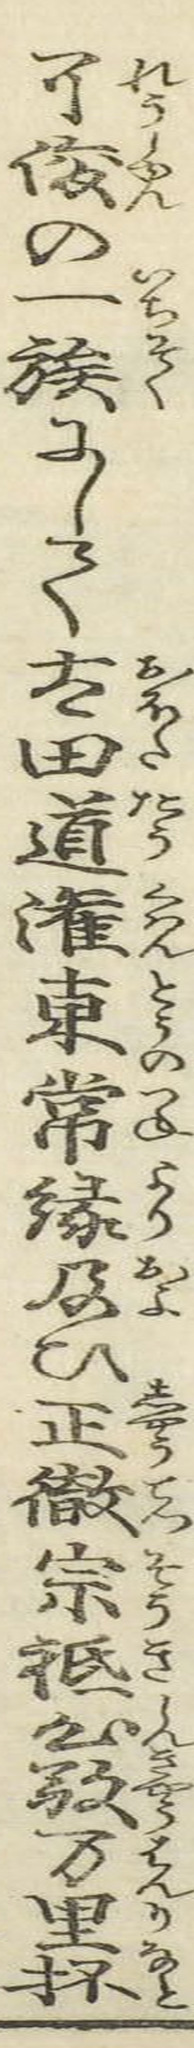了俊の一族にして太田道潅東常縁及ひ正徹宗祗心敬万里抔
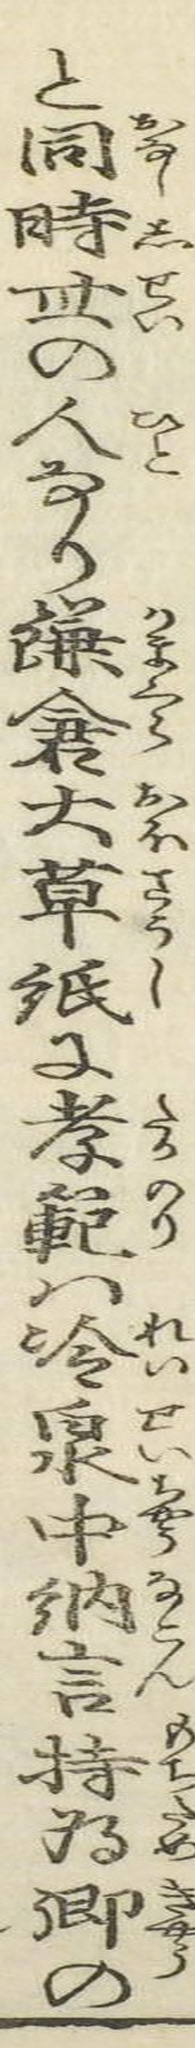と同時世の人なり鎌倉大草子に孝範は冷泉中納言持為卿の
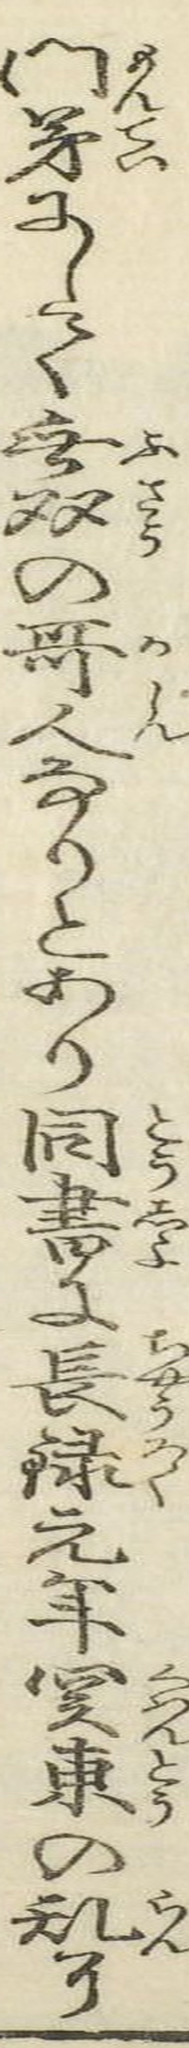門弟にして無双の哥人なりとあり同書に長禄元年関東の乱に
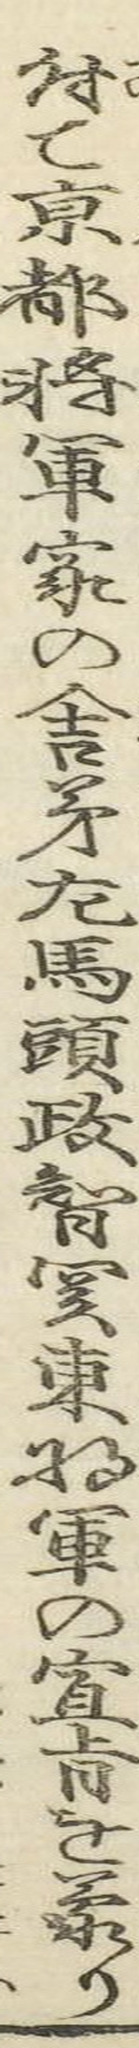付て京都将軍家の舎弟左馬頭政智関東将軍の宣旨を蒙り
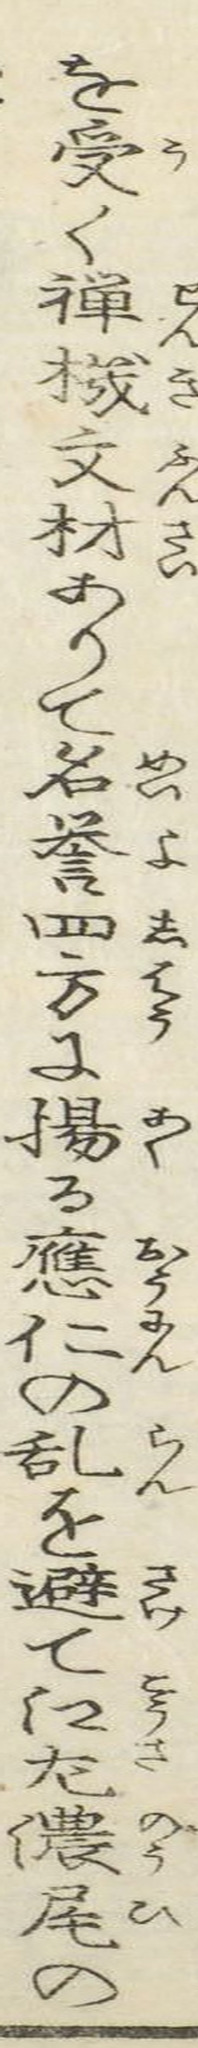を受く禅機文材ありて名誉四方に揚る応仁の乱を避て江左濃尾の
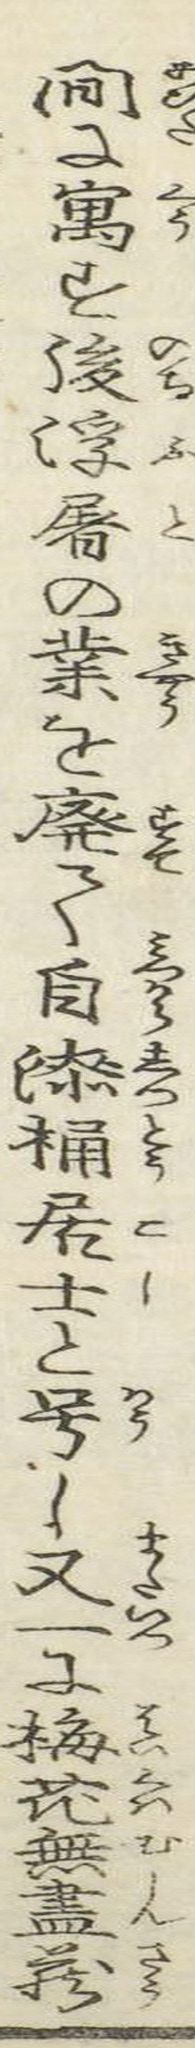間に寓す後浮屠の業を廃て自漆桶居士と号し又一に梅花無尽蔵
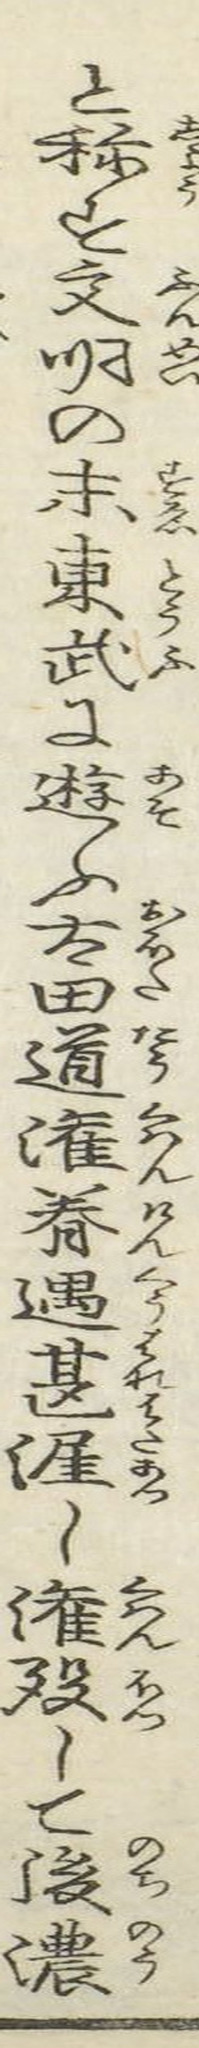と称す文明の末東武に遊ふ太田道潅眷遇甚渥し潅歿して後濃
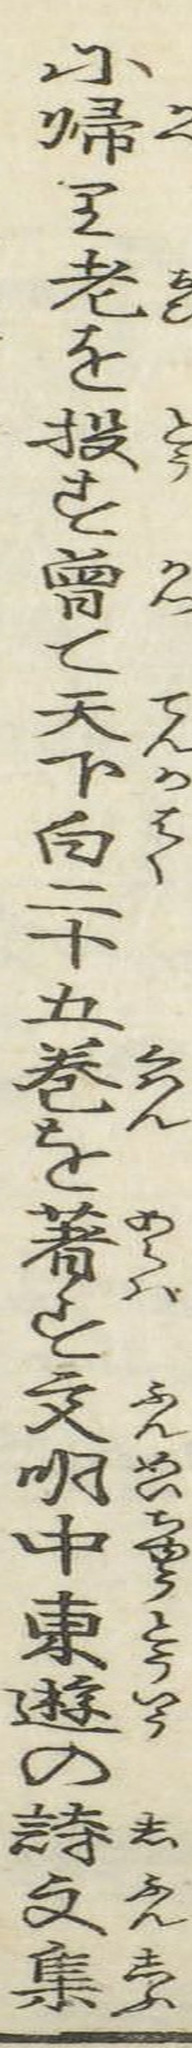に帰り老を投す曽て天下白二十五巻を著す文明中東遊の詩文集
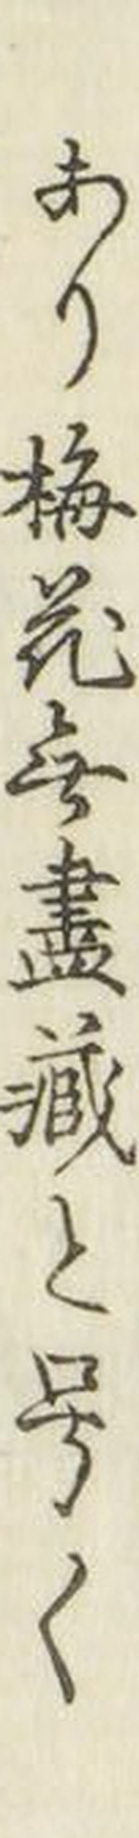あり梅花無尽蔵と号く
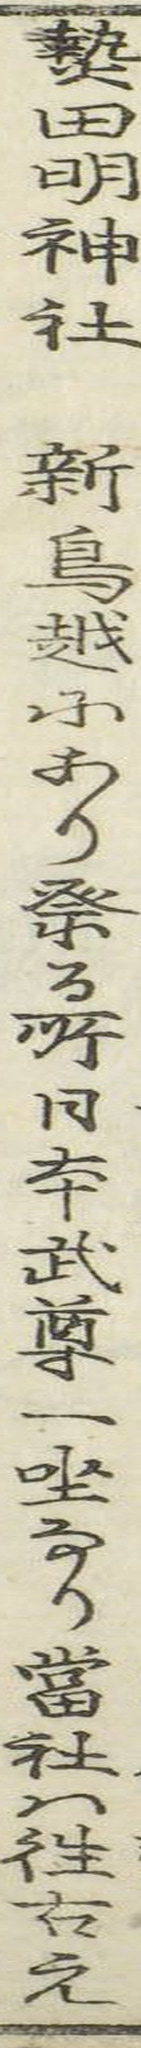熱田明神社新鳥越にあり祭る所日本武尊一坐なり当社は往古元
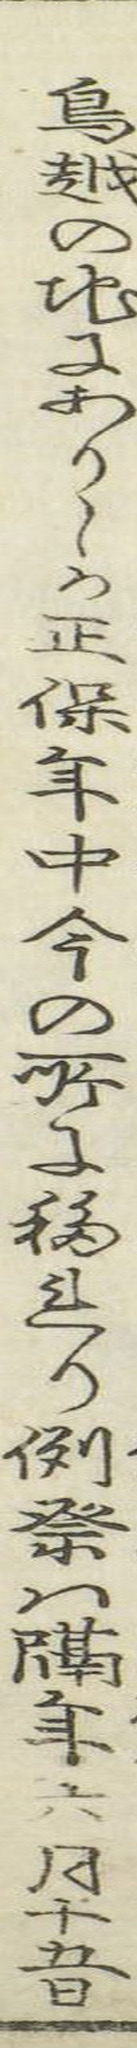鳥越の地にありしか正保年中今の所に移れり例祭は隔年六月十五日
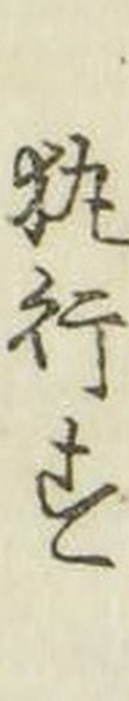執行す
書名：江戸名所図会 20巻 巻之17
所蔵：東京学芸大学教育コンテンツアーカイブ
